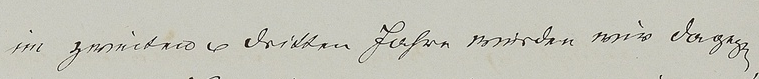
im zweiten & dritten Jahre werden wir dagegen,
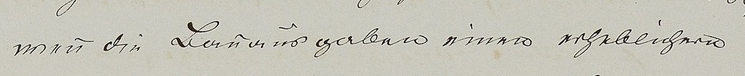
wenn die Bauausgaben einen erheblichern
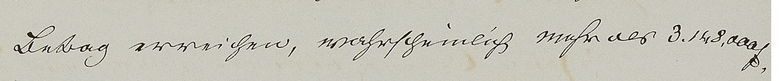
Betrag erreichen, wahrscheinlich mehr als 3.148,000
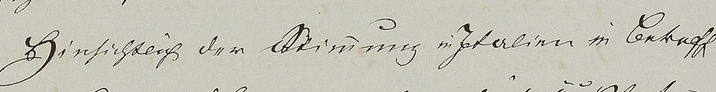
Hinsichtlich der Stimmung in Italien in Betreff
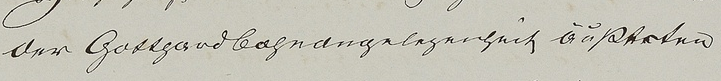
der Gotthardbahnangelegenheit äußerten
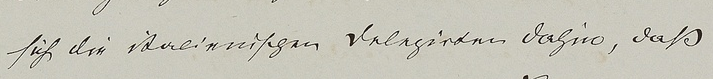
sich die italienischen Delegirten dahin, daß
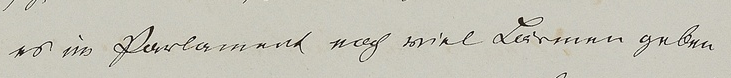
es im Parlament noch viel Lärmen geben
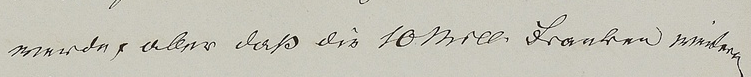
werde, aber daß die 10 Mill. Franken weiterer
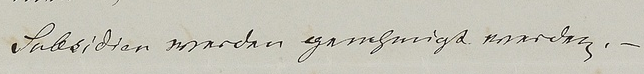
Subsidien werden genehmigt werden. –
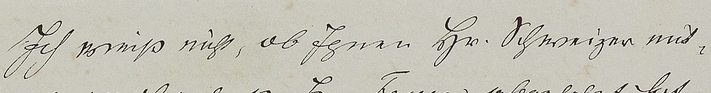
Ich weiß nicht, ob Ihnen Hr. Schweizer mit-
